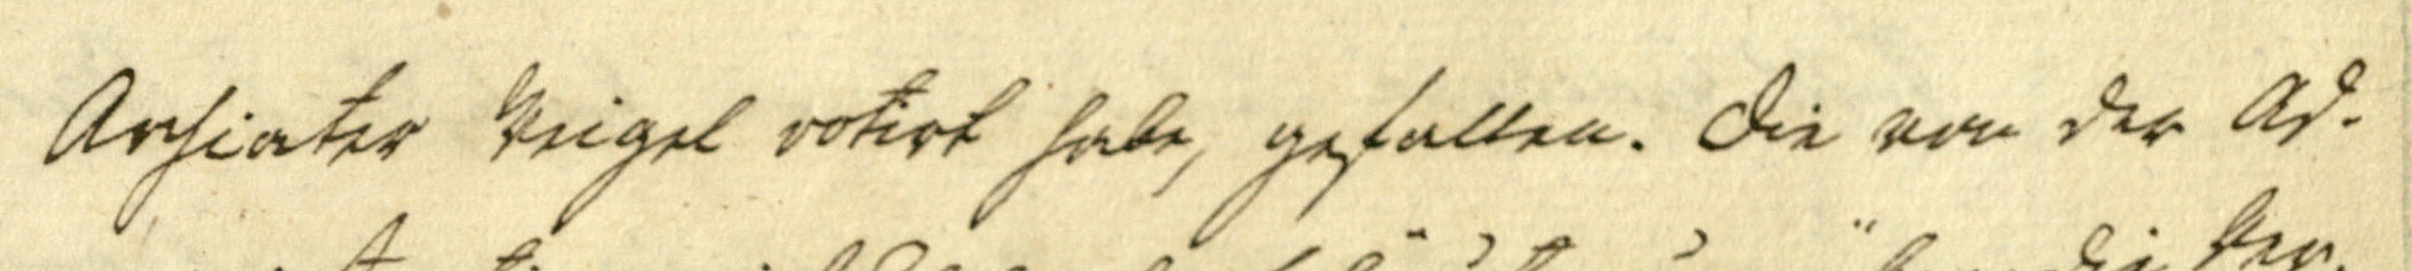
Archiater Weigel votirt habe, gefallen. Die von der Ad¬
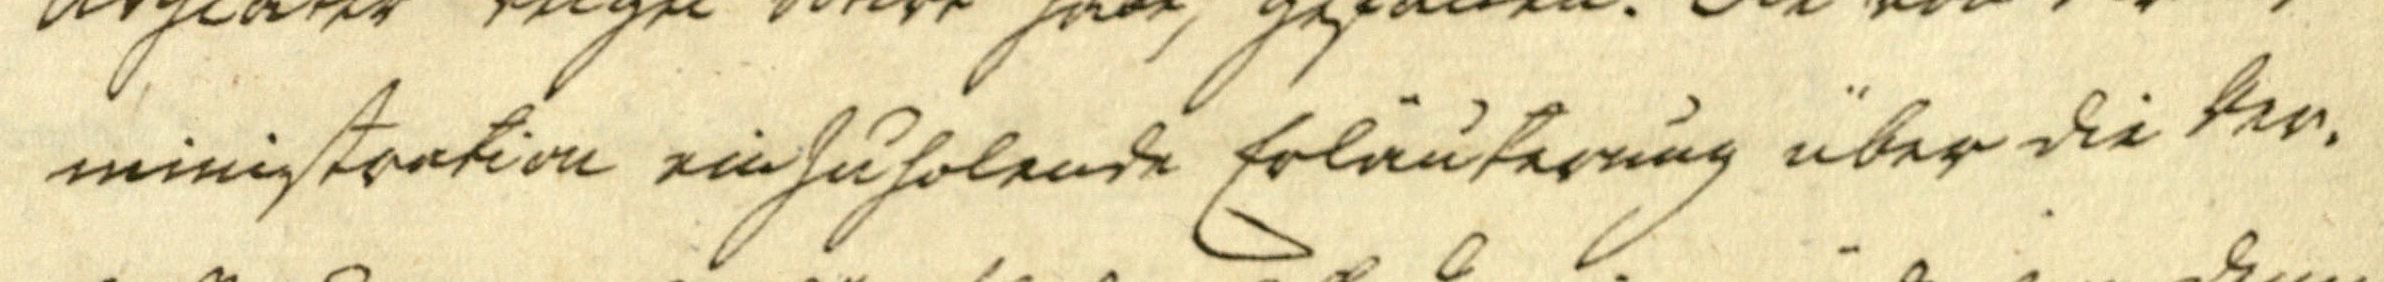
ministration einzuholende Erläuterung über die Ver¬
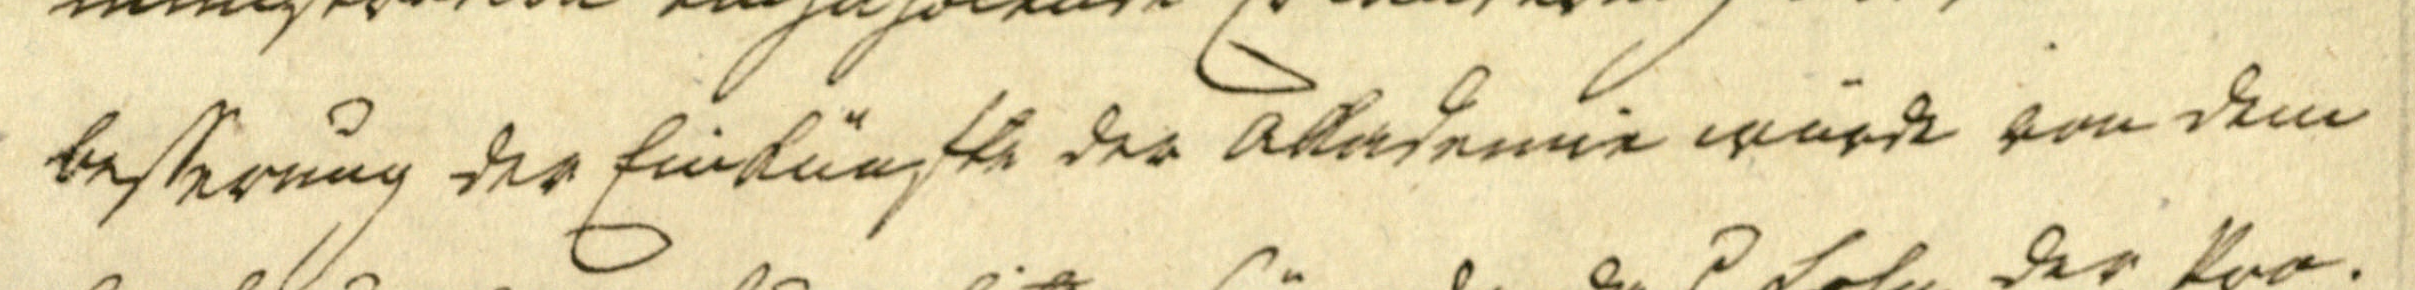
besserung der Einkünfte der Akademie würde von dem
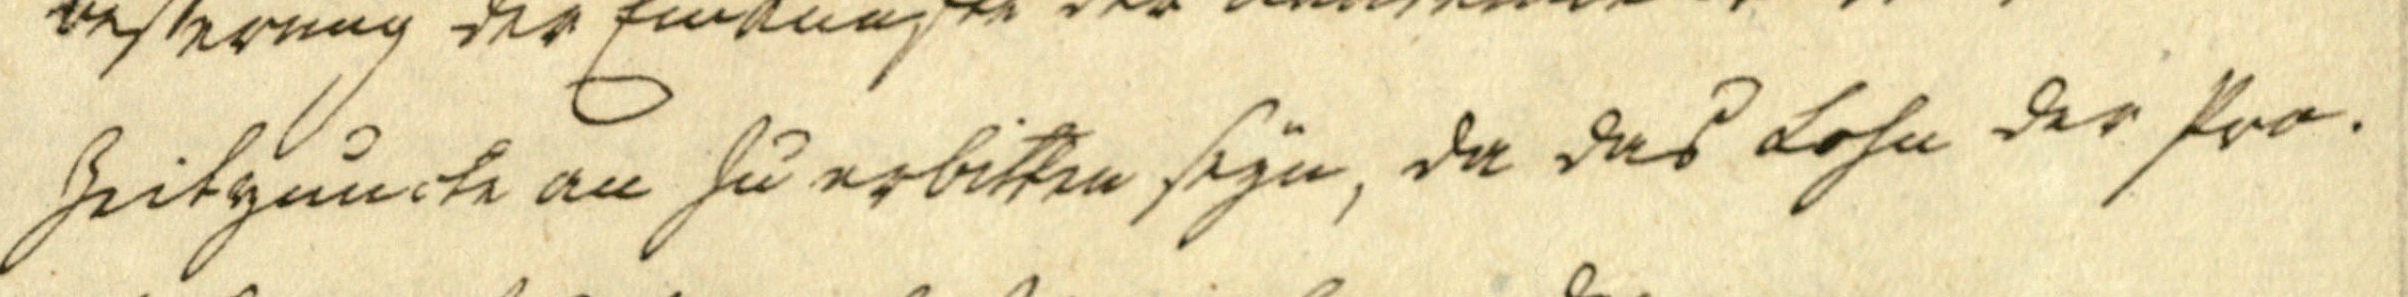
Zeitzuncte an zu erbitten seÿn, da das Lohn der Pro¬
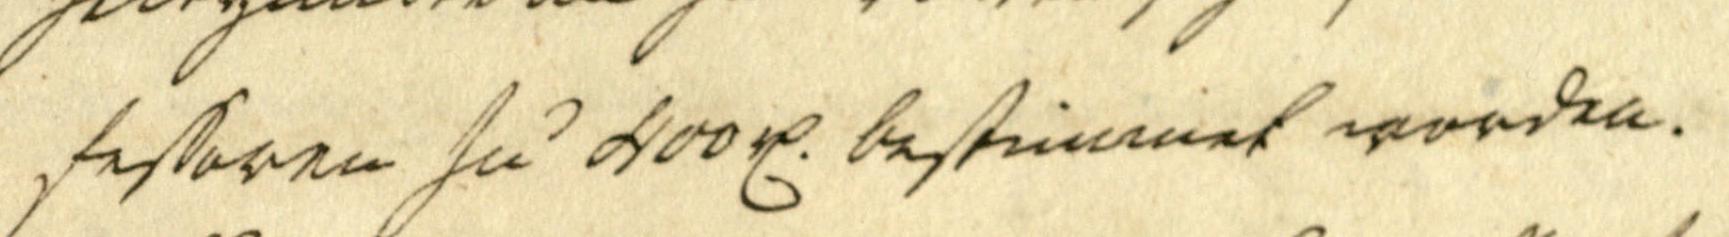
fessoren zu 400 rl. bestimmet worden.
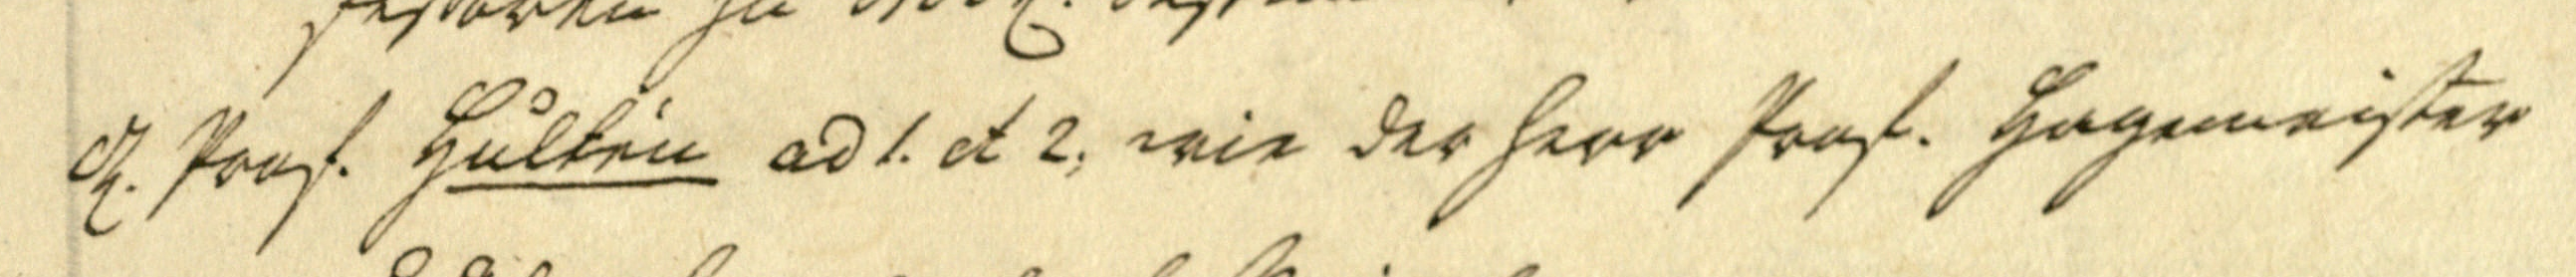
dh. Prof. Hultén ad 1. et 2, wie der Herr Prof. Hagemeister
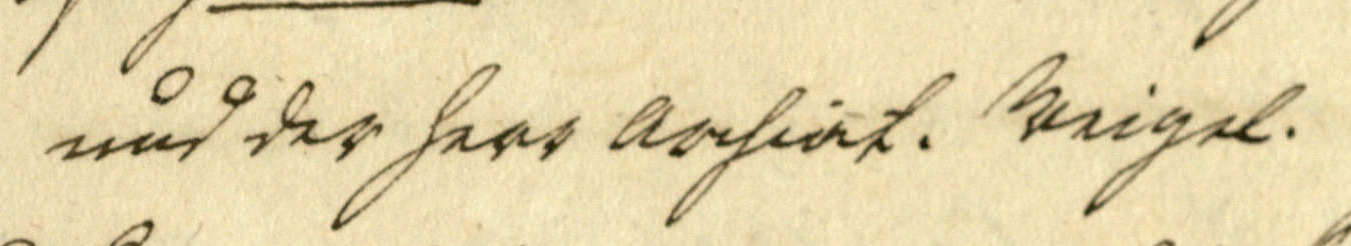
und der Herr Archiat. Weigel.
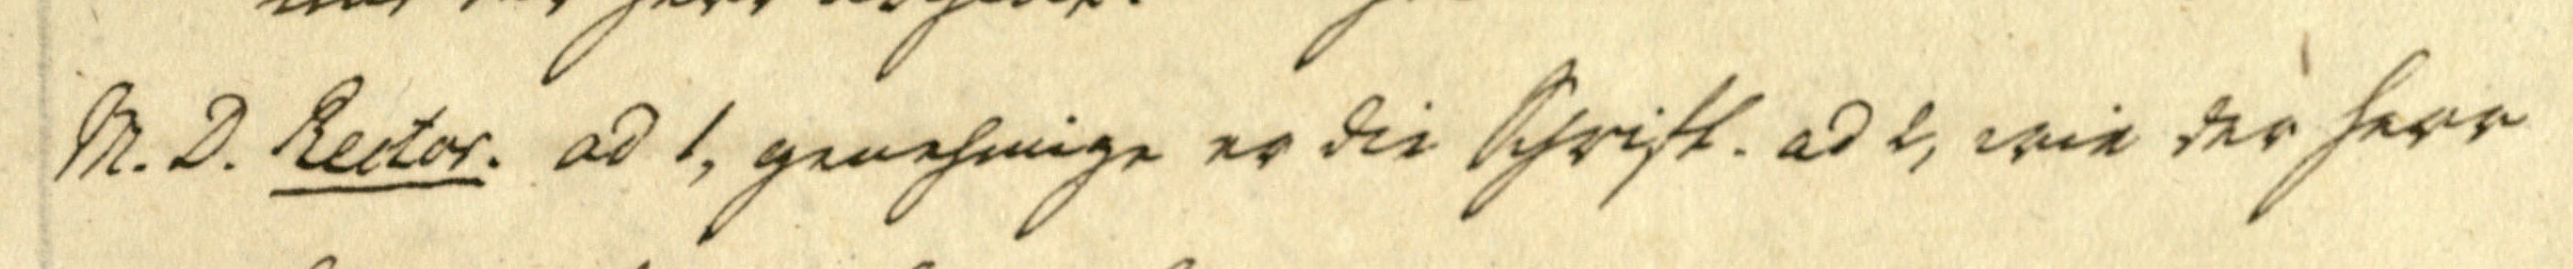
M. D. Rector. ad 1. genehmige er die Schrift. ad 2, wie der Herr
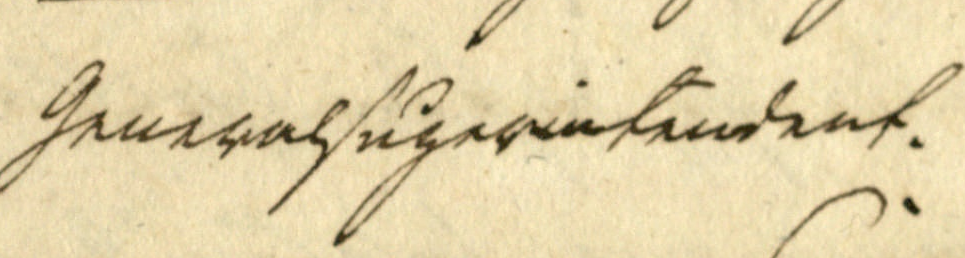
Generalsuperintendent.
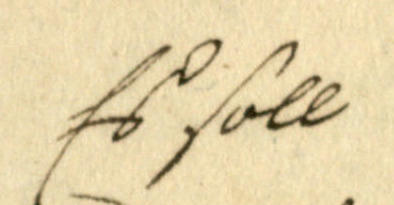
Es soll
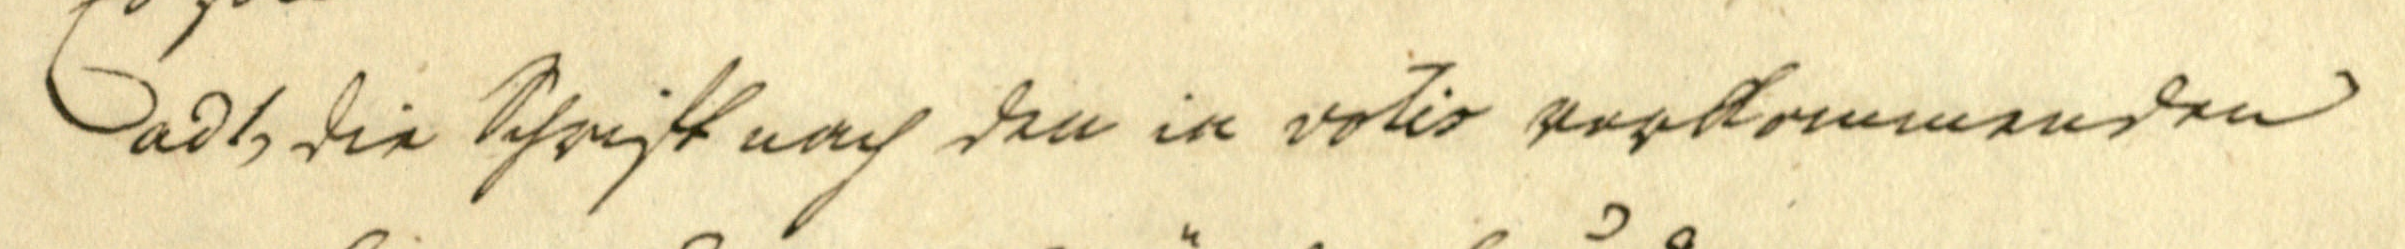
ad 1., die Schrift nach den in votis vorkommenden
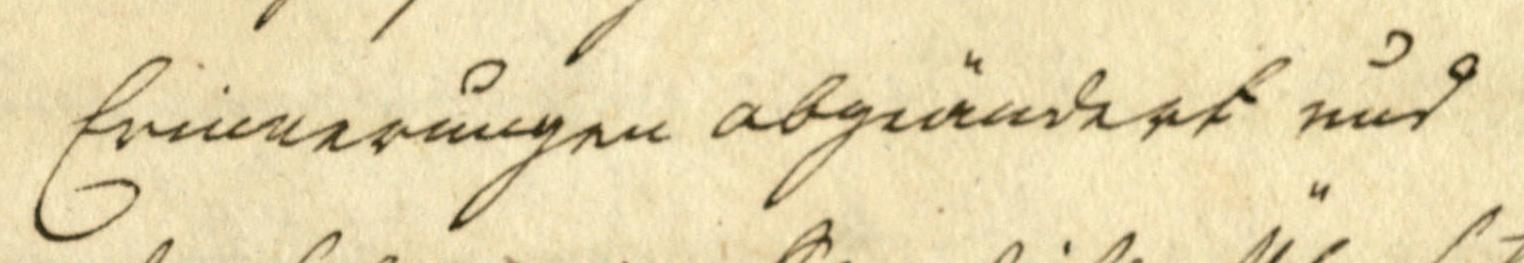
Erinnerungen abgeändert und
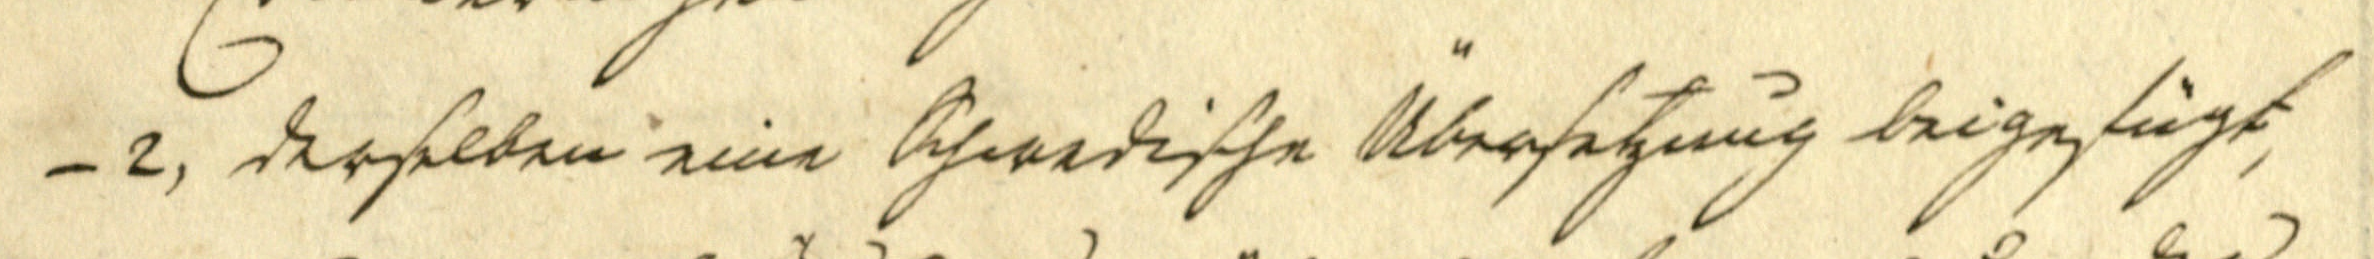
2, derselben eine Schwedische Übersetzung beigefügt,
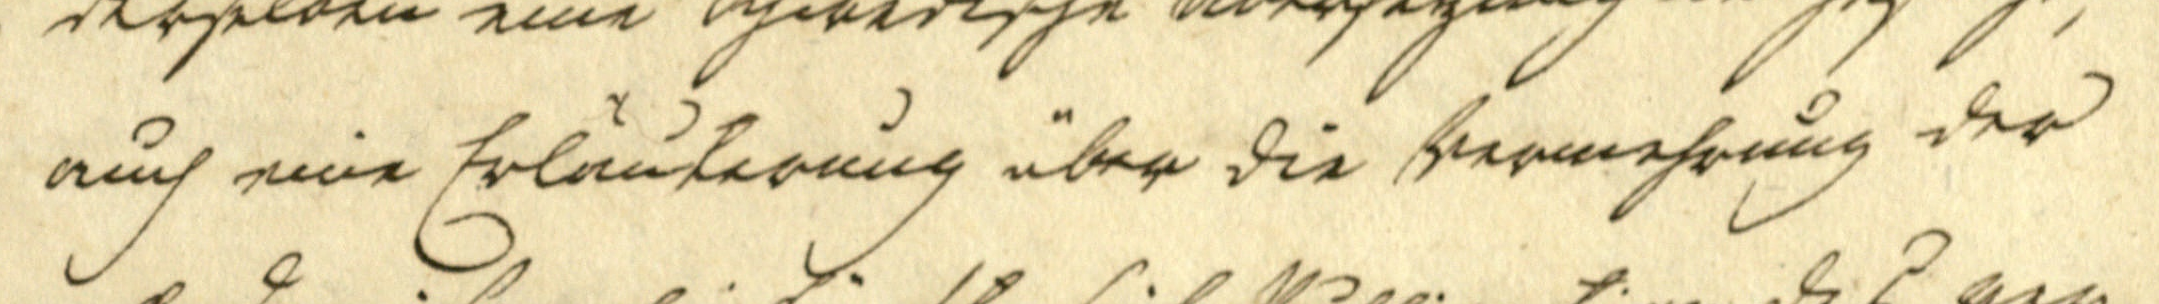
auch eine Erläuterung über die Vermehrung der
